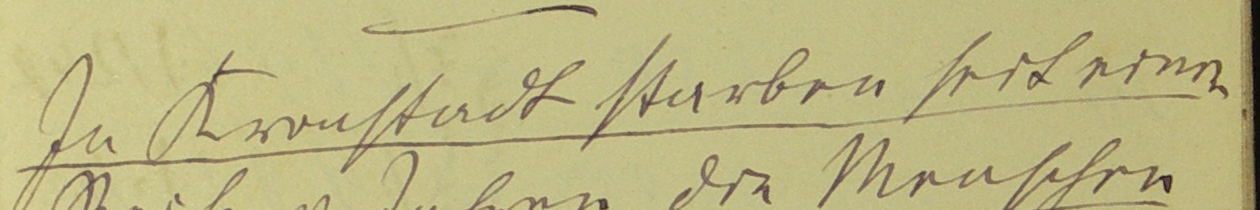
In Kronstadt starben seit einer
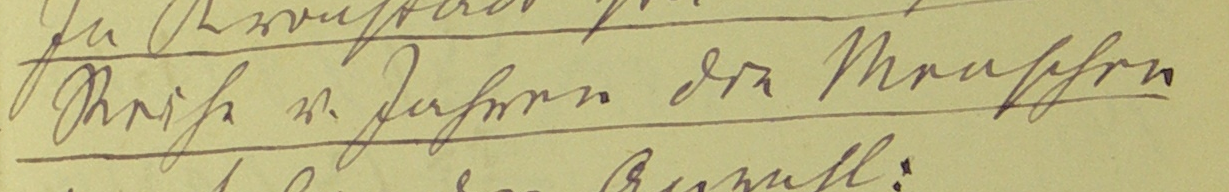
Reihe von Jahren die Menschen
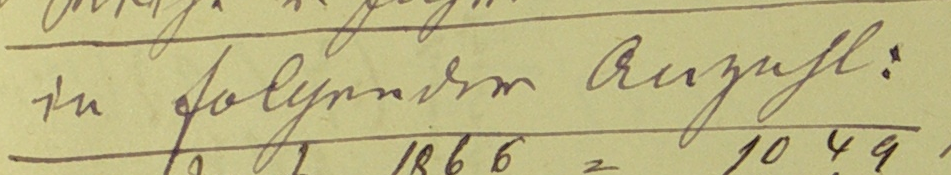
in folgender Anzahl:
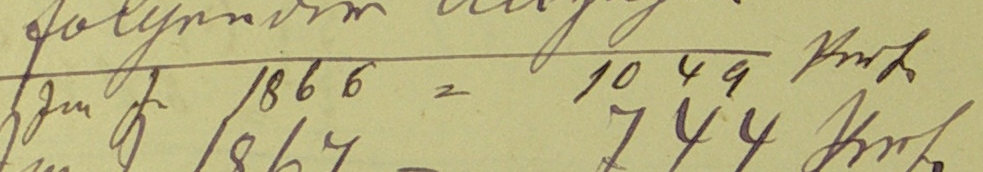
Im Jahr 1866 = 1049 Personen
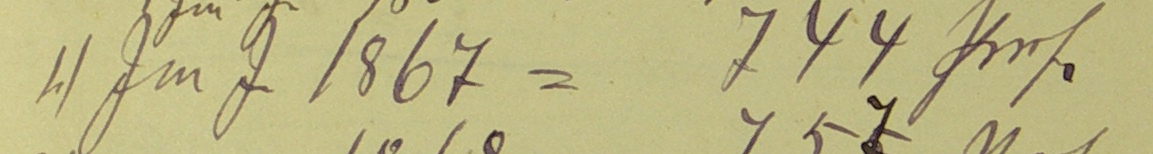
1.) * 1867 = 744 *
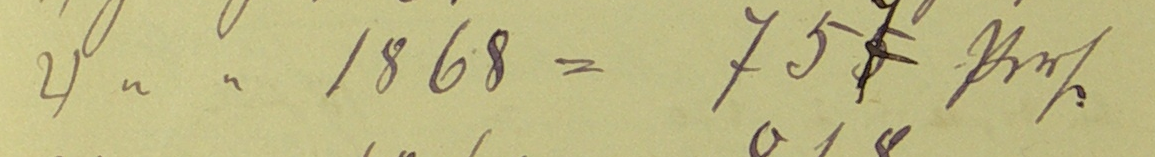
2.) * 1868 = 757 *
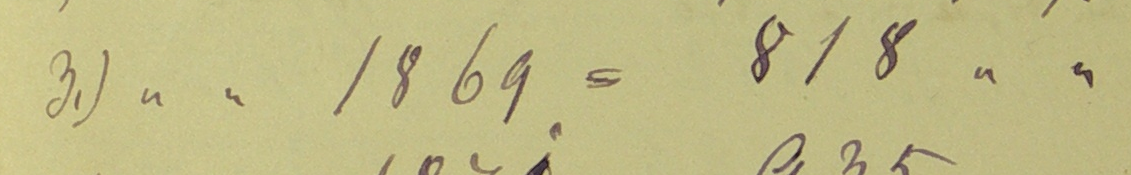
3.) * 1869 = 818 *
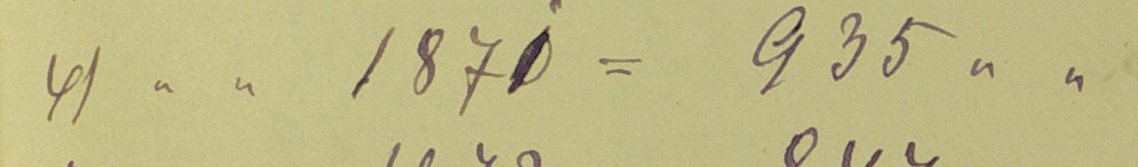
4.) * 1871 = 935 *
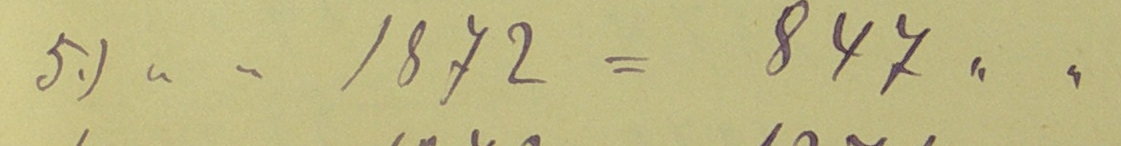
5.) * 1872 = 847 *
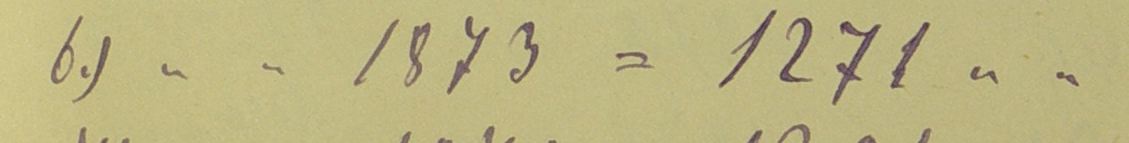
6.) * 1873 = 1271 *
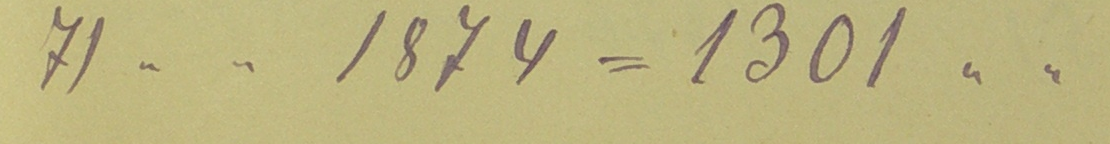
7.) * 1874 = 1301 *
